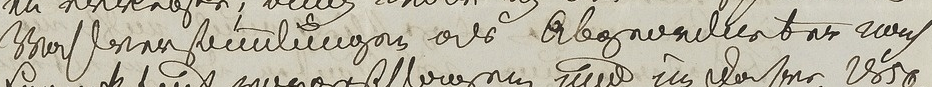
Wahlversammlungen als Abgeordneter nach
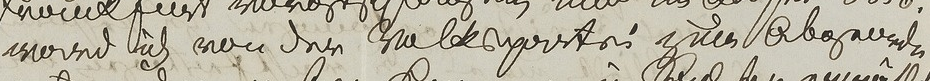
ward ich von der Volkspartei zum Abgeord-
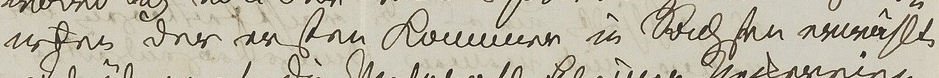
neten der ersten Kammer in Sachsen erwählt.
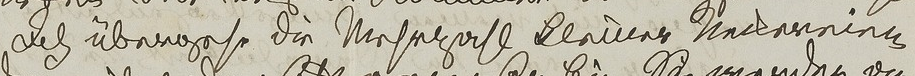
Ich übergehe die Mehrzahl kleiner Neckereien,
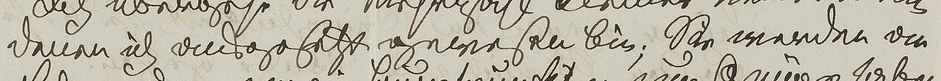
denen ich ausgesetzt gewesen bin; Sie werden an
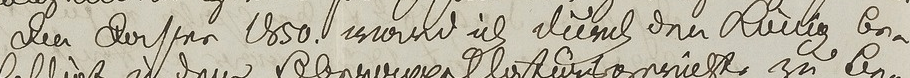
Im Jahre 1850. ward ich durch den König be-
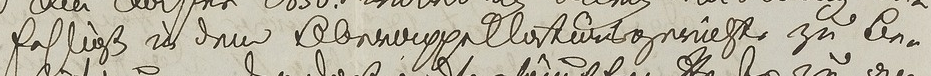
fehligt, in dem Oberappellationsgerichte zu Be-
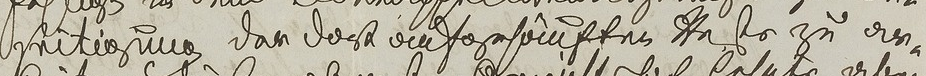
seitigung der dort aufgehäuften Reste zu ar-
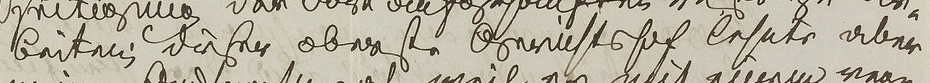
beiten, dieser oberste Gerichtshof lehnte aber
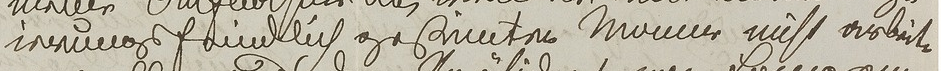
ierungsfeindlich gesinnten Mann nicht arbeit-
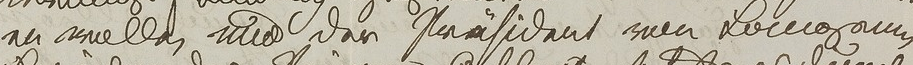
en wolle, und der Präsident von Langenn
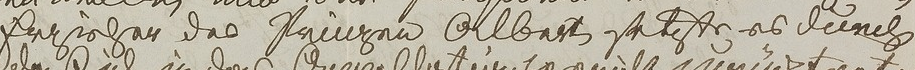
Erzieher des Prinzen Albert setzte es durch,
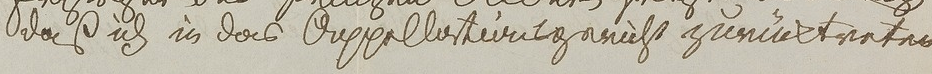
daß ich in das Appellationsgericht zurücktreten
